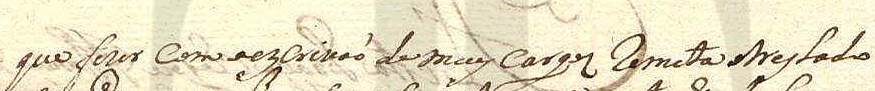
que fizer com o escrivaõ de meus cargoz Remeta o treslado
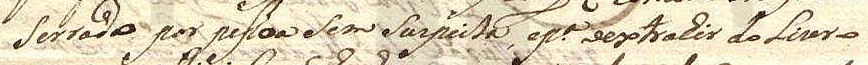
serrado por pessoa sem suspeita, e p.a o extrahir do Livro
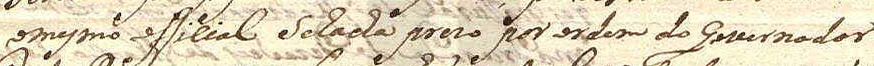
o mesmo official se hacha prezo por ordem do Governador
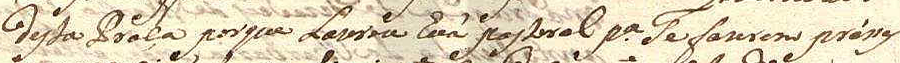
desta Praça porque Lavrou huā pastoral p.a se fazerem présses
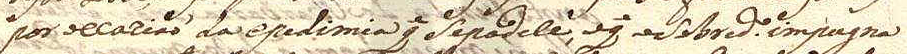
por occaziaõ da epedimia q̄ se padece, o q̄ o sobred.o impugna
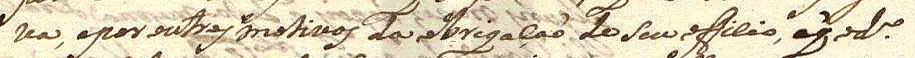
va, e por outros motivos da obrigaçaõ de seu officio, a q̄ o d.o
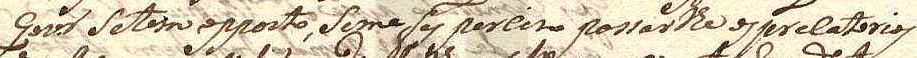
Gov.r se tem opposto, se me fes percizo passarlhe os precatorios
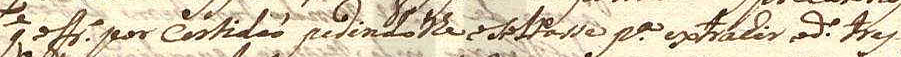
q̄. offr.o por certidaõ pedindolhe o soltasse p.a extrahir o d.o tres
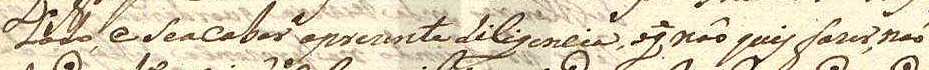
lado, e se acabar a prezente diligencia, o q̄ naõ quis fazer, naõ
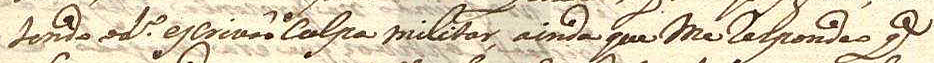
tendo o d.o escrivaõ Culpa militar, ainda que me Respondeo q̄
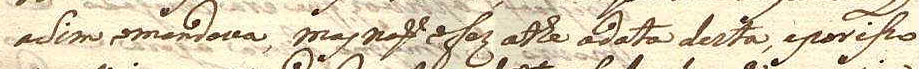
aSim o mandava, mas naõ o fez athe a data desta, e por isso
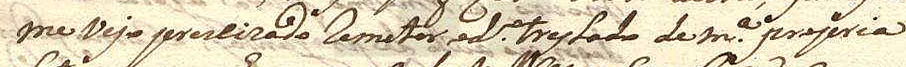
me vejo prescizado Remeter o d.o treslado de m.a propria
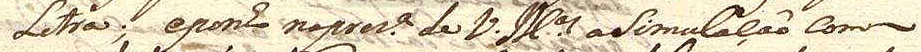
Letra; e ponho na prez.a de V. Ill.as a simulaçaõ com
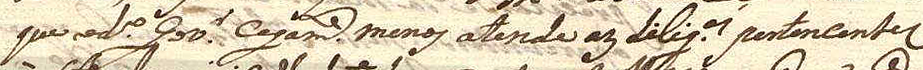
que o d.o Gov.r cegam.te menos atende az dilig.as pertencentes
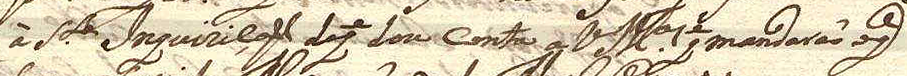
à S.ta Inquiziçaõ do q̄ dou conta a V. Ill.as q̄ mandaraõ o q̄
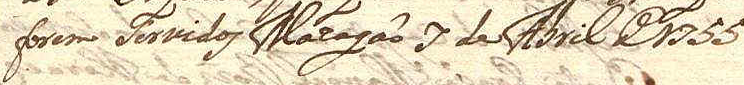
forem servidos Mazagaõ 7 de Abril d̄ 1755
